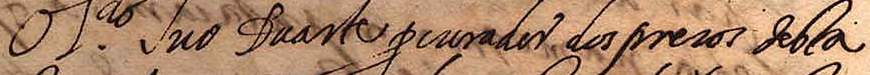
O L.do Iuo Duarte ꝓcurador dos prezos desta
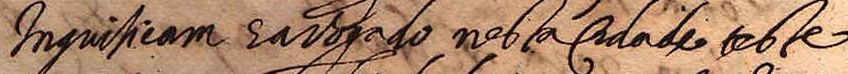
Inquisiçam E avogado nesta Cidade teste
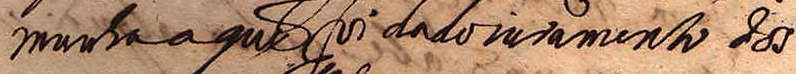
munha a quē foi dado iuramento dos
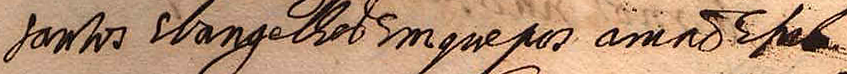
santos Evangelhos Em que pos a maõ E sob
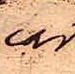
car
